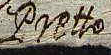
Pretto
